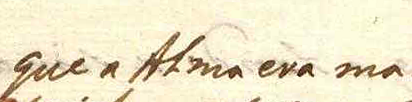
que a Alma era ma
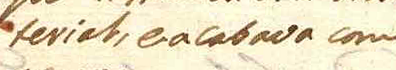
terial, e acabava com
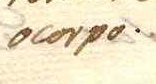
o corpo.
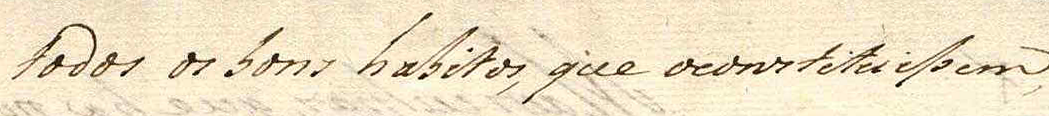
todos os bons habitos, que o constituissem,
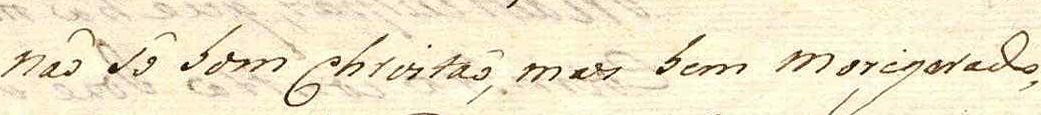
naõ só bom Christaõ mas bem morigerado,
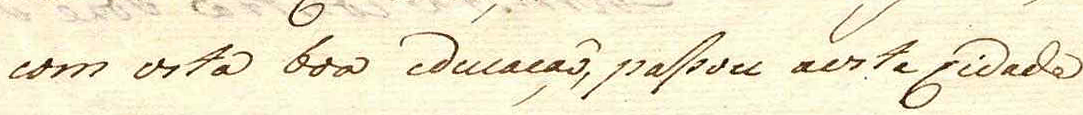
com esta boa educaçaõ, passou a esta Cidade
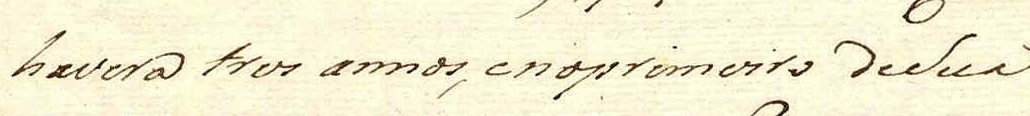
havera tres annos, e no primeiro de Sua
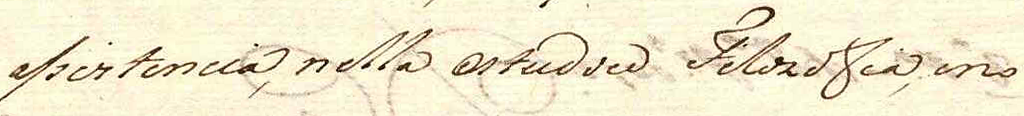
assistencia, nella estudou Filozofia, e no
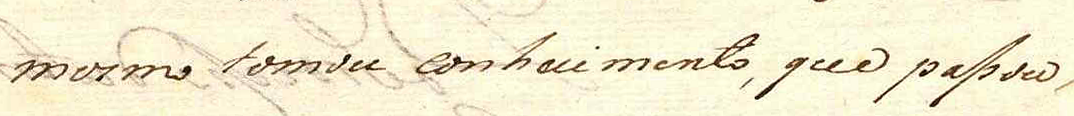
mesmo tomou conhecimento, que passou
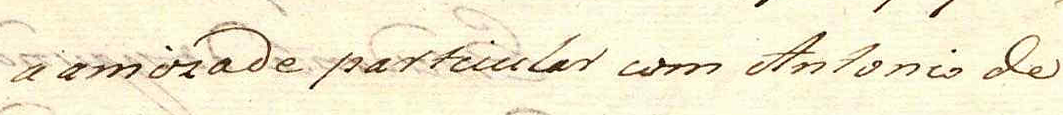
a amizade particular com Antonio de
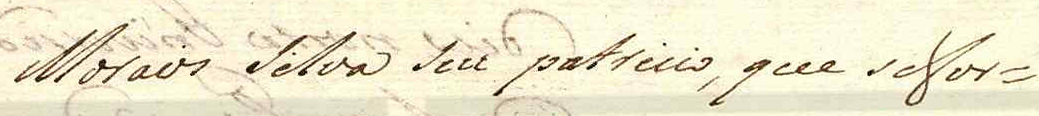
Morais Silva seu patricio, que se for
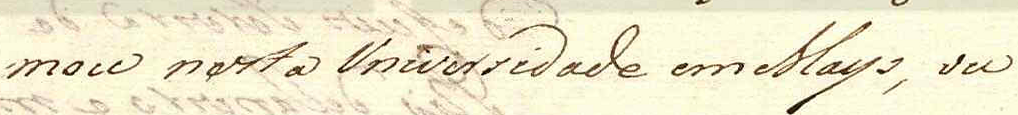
mou nesta Universidade em Mayo, ou
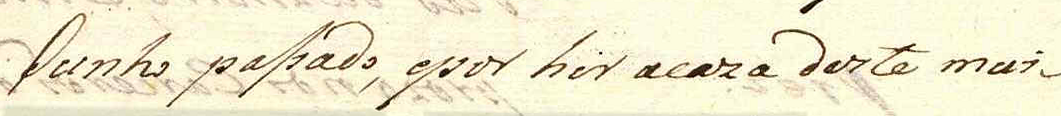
Iunho paSsado, e por hir a caza deste mui
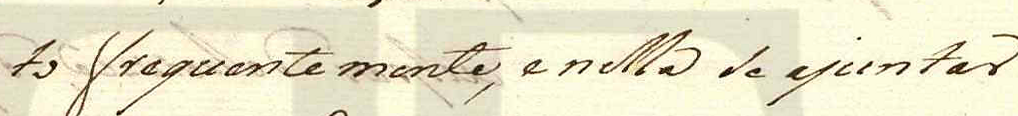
to frequentemente, e nella se ajuntar
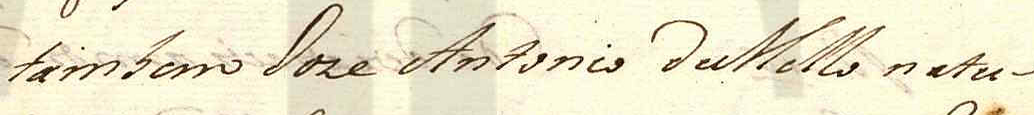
tambem Ioze Antonio de Mello natu
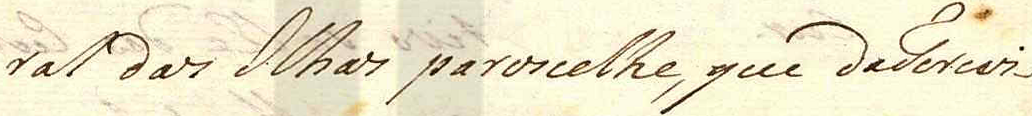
ral das Ilhas parescelhe, que da Tercei
